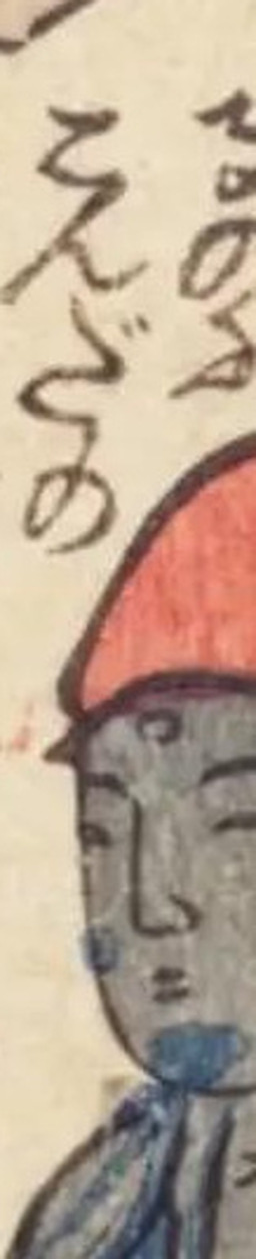こんだの
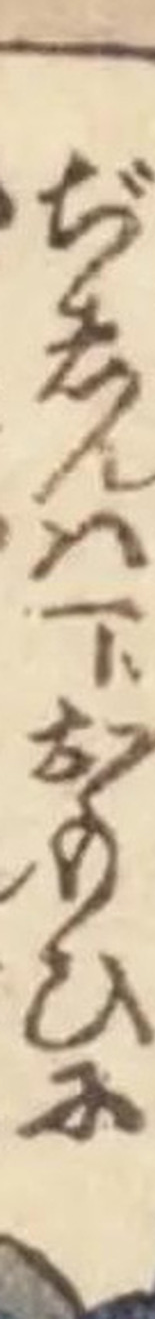ぢしんは一トおもひに
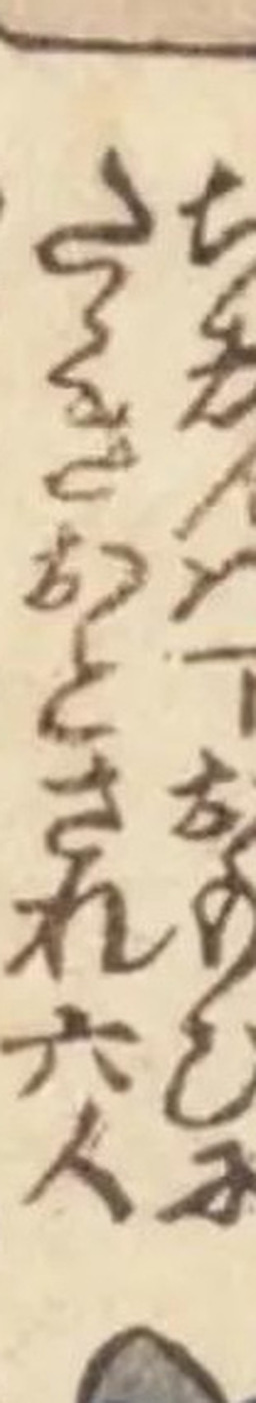たゝきおとされ六人
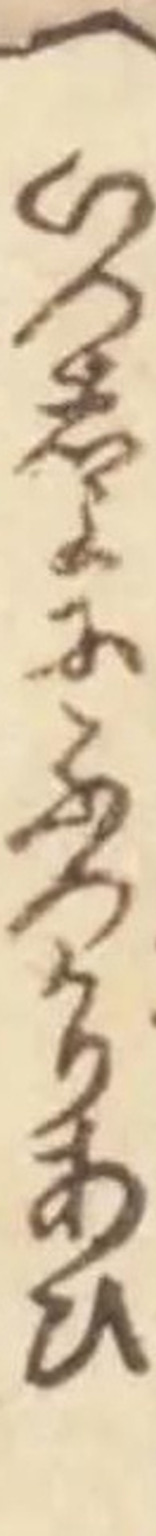いつしよにふつかりあひ
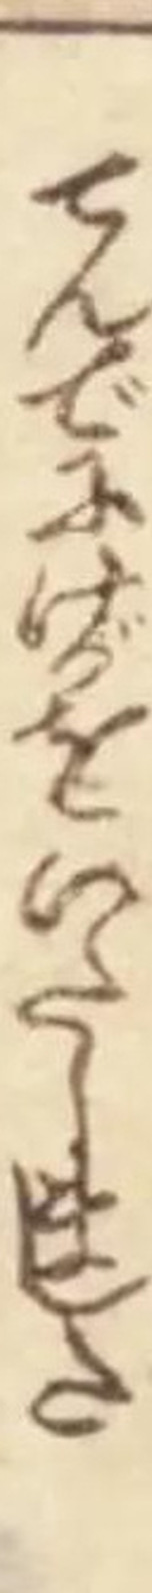てんでにけがをいたしました
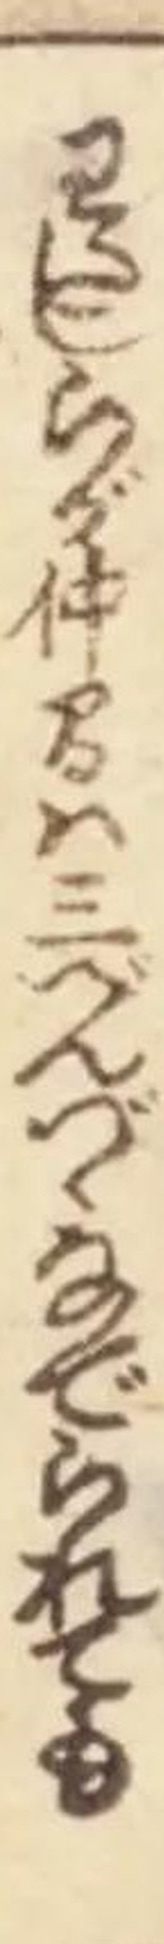わたしらが仲間は三べんづゝなでられても
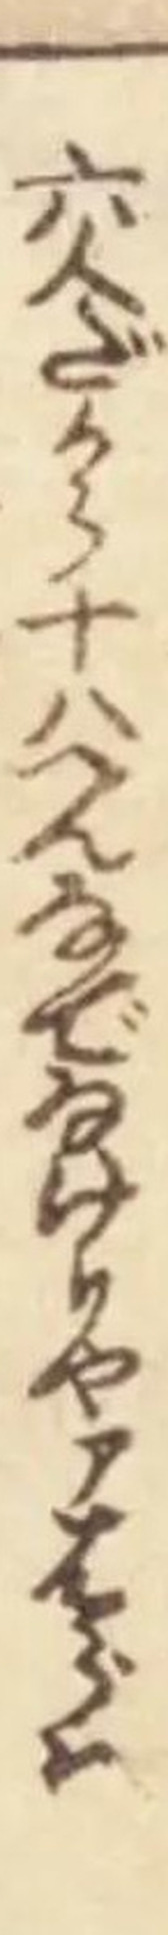六人だから十八へんなでなけりやアはらは
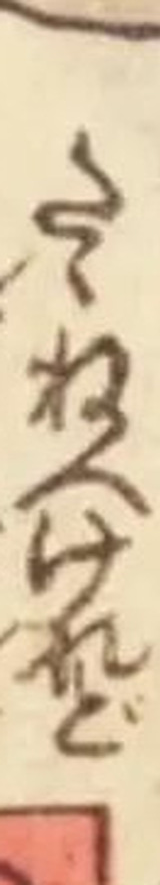たゝねへけれど
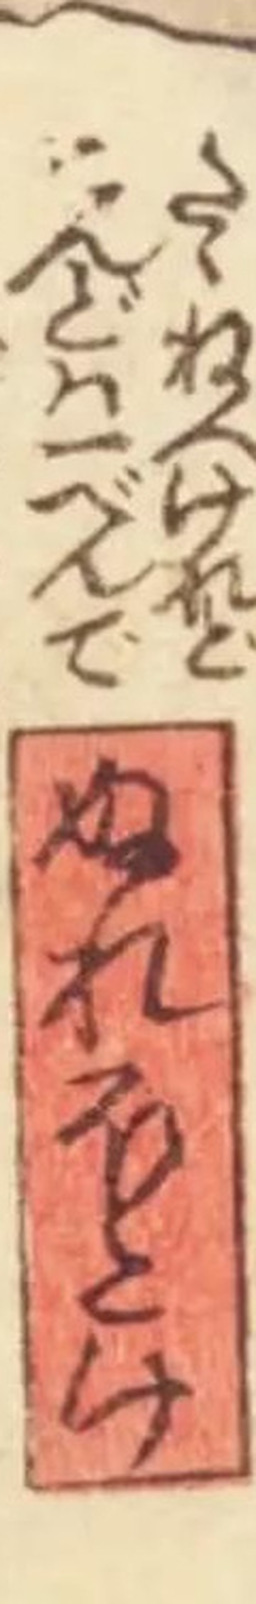こんどは一べんで
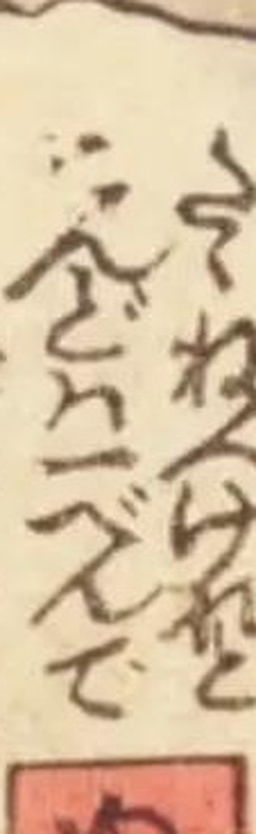こんどは一べんで
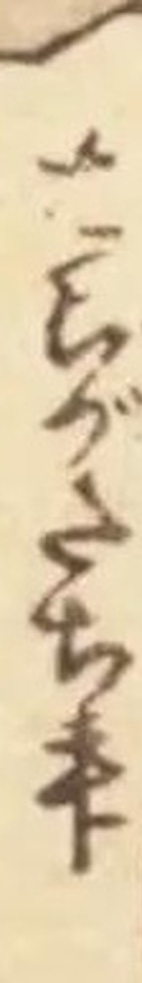はらがたち升
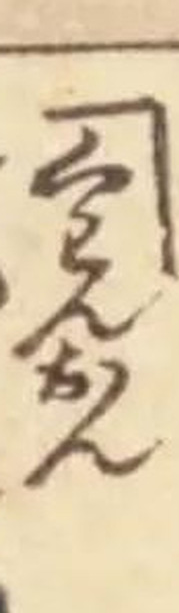「くわんおん
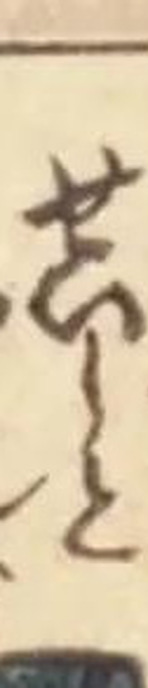せいしと
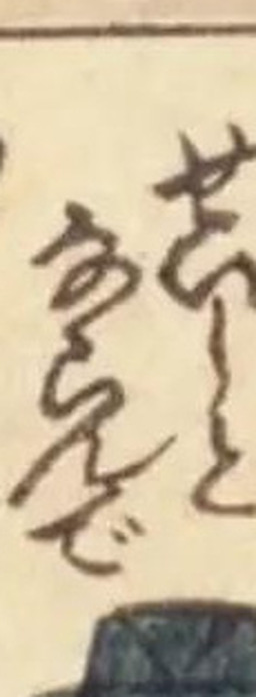ならんで
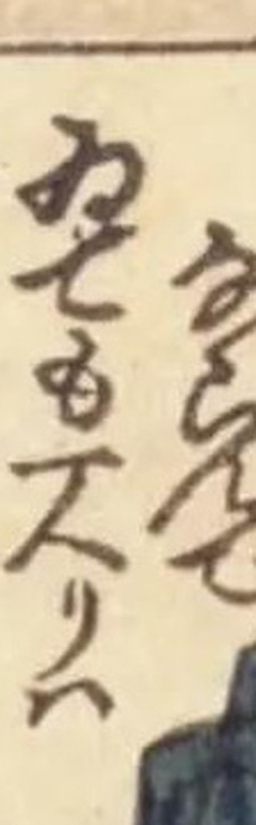ゐても一人りは
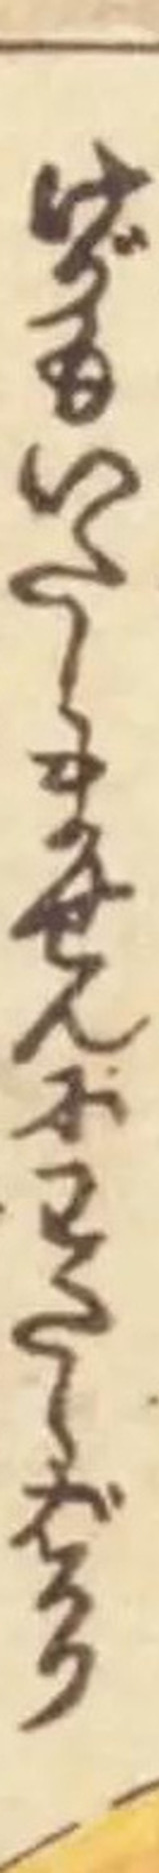けがもいたしませんにわたしばかり
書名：安政二年十月二日地震出火後日角力
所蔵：国立国会図書館 National Diet Library, JAPAN
